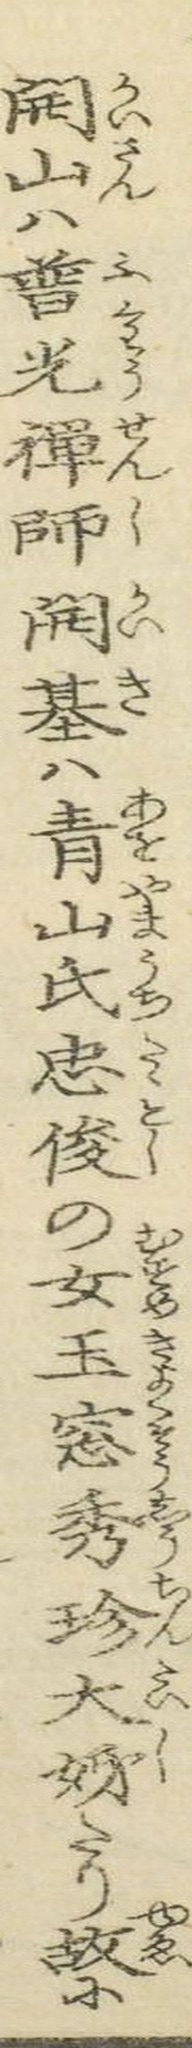開山は普光禪師開基は青山氏忠俊の女玉窓珍大姊たり故に
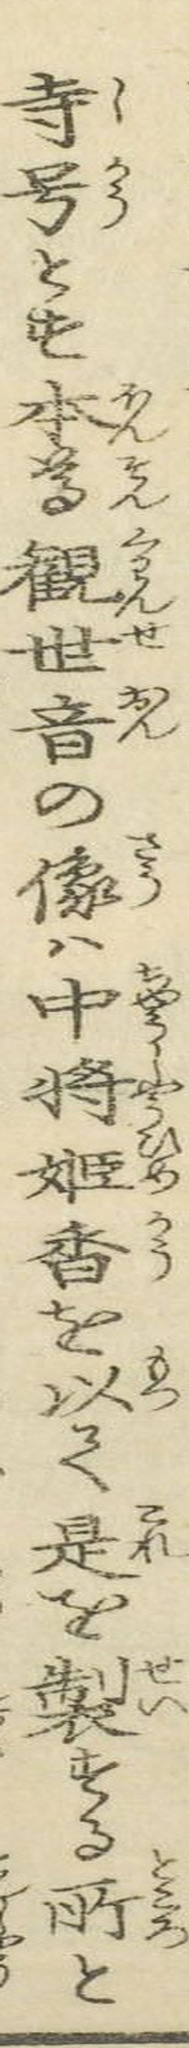寺号とす本尊観世音の像は中將姫香を以て是を製する所と
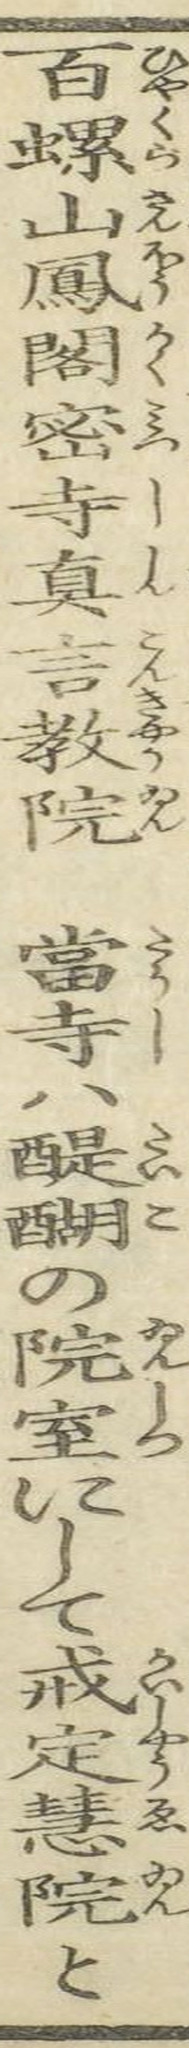百螺山鳳閣密寺真言教院當寺は醍醐の院室にして戒定慧院と
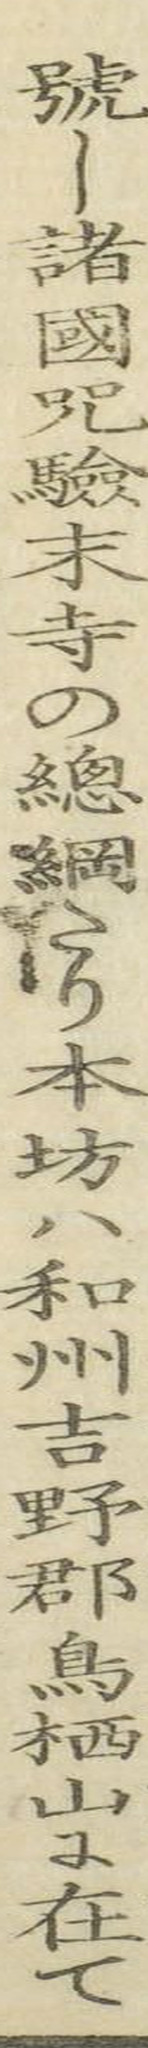號し諸國咒驗末寺の總綱たり本坊は和州吉野郡鳥栖山に在て
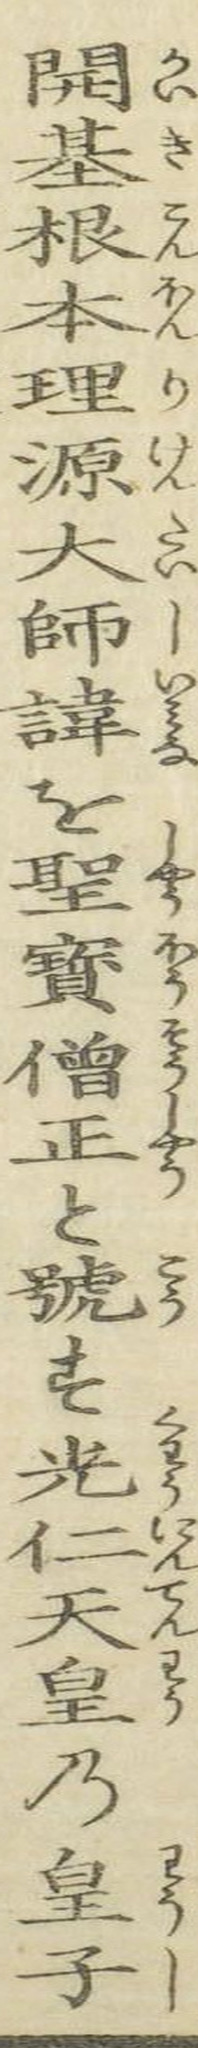開基根本理源大師諱を聖寳僧正と號す光仁天皇の皇子
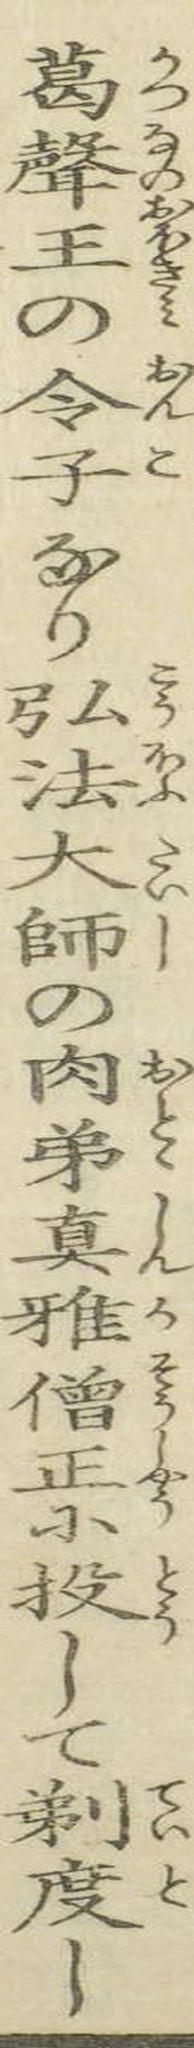葛聲王の令子なり弘法大師の肉弟真雅僧正に投して剃度し
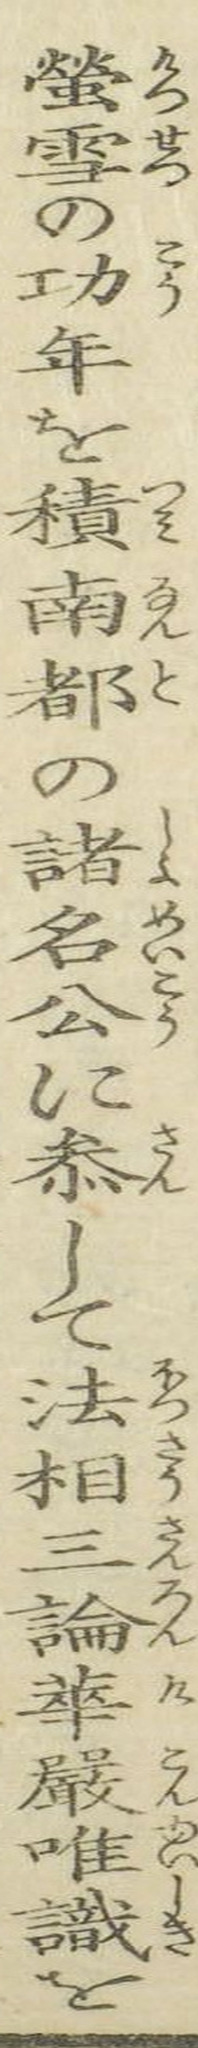螢雪の功年を積南都の諸名公に𠫵して法相三論蕐嚴唯識を
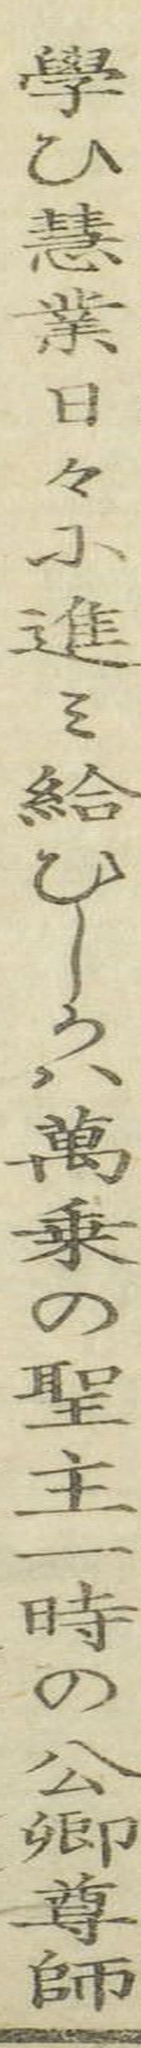學ひ慧業日々に進み給ひしかは萬乗の聖主一時の公卿尊師
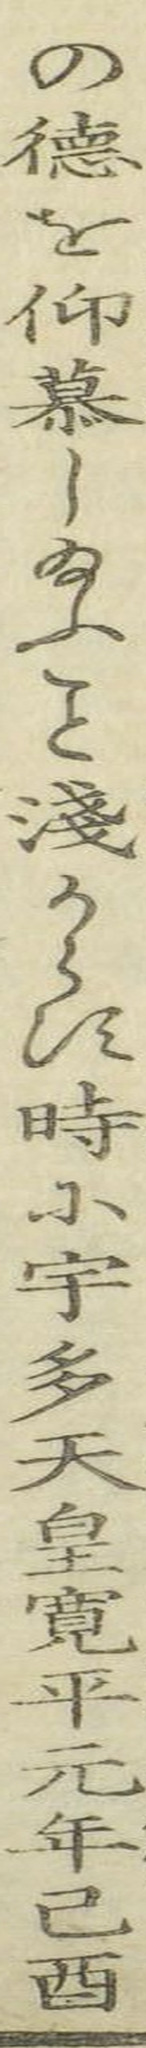の德を仰慕し給ふこと淺からす時に宇多天皇寛平元年己酉
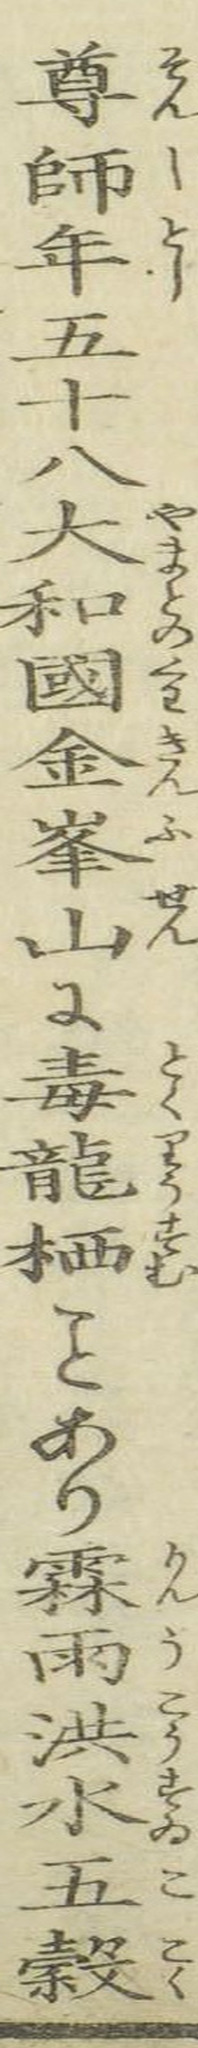尊師の年五十八大和國金峯山に毒龍栖ことあり霖雨洪水五穀
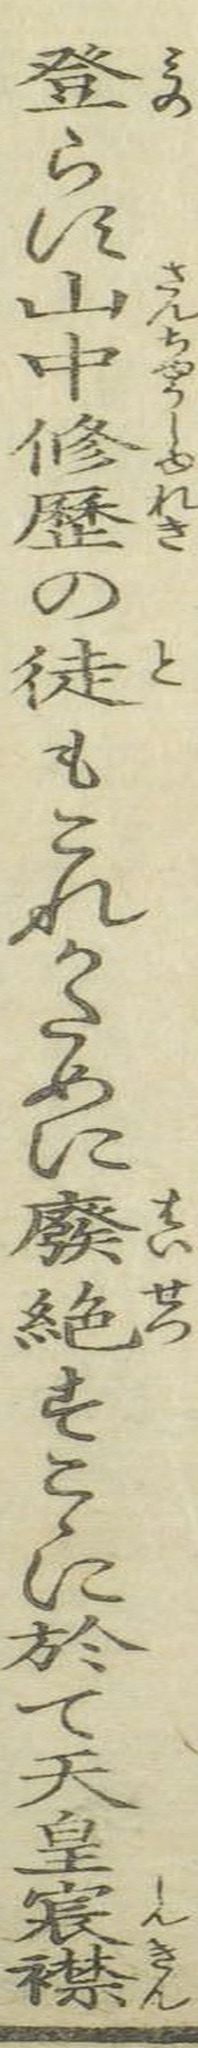登らす山中修歴の徒もこれかために廢絶すこゝに於て天皇宸襟
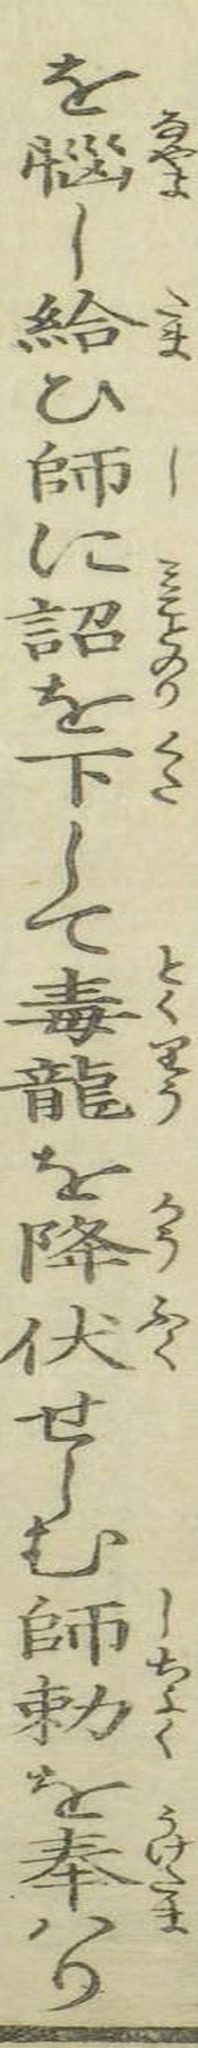を惱し給ひ師に詔を下して毒龍を降伏せしむ師勅を奉はり

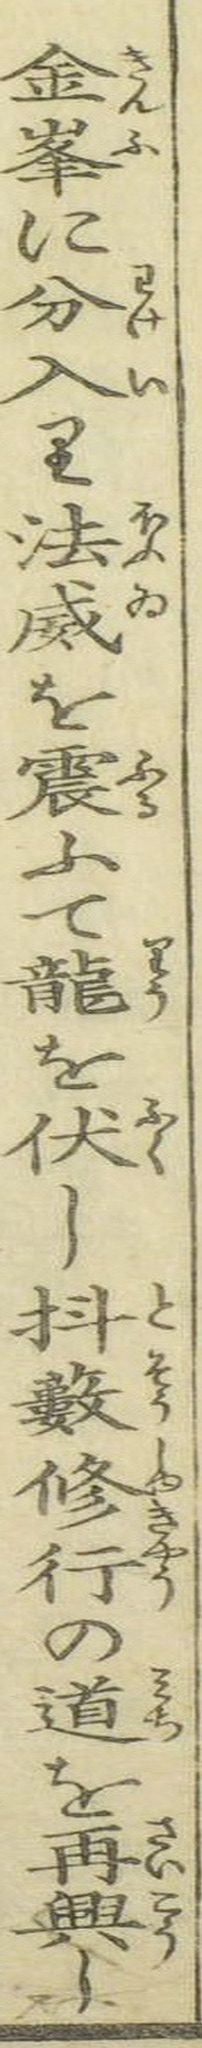金峯に分入り法威を震ふて龍を伏し抖藪修行の道を再興し
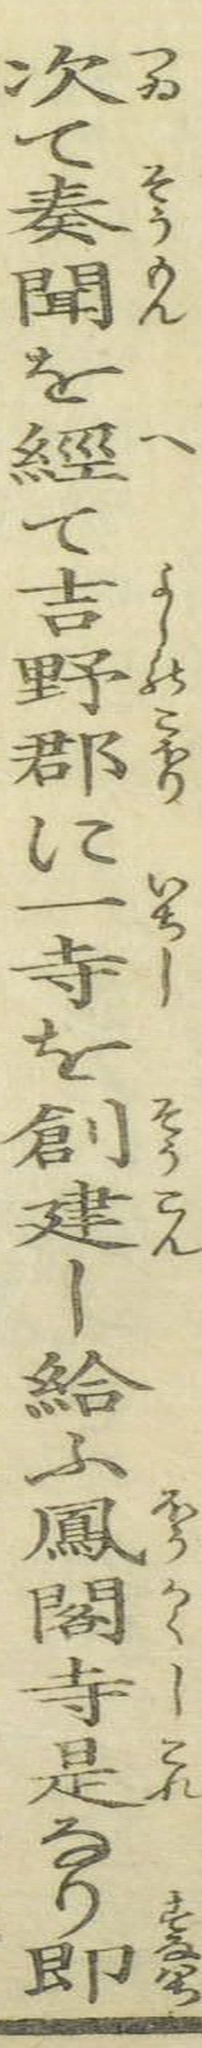次て奏聞を經て吉野郡に一寺を創建し給ふ鳳閣寺是なり即
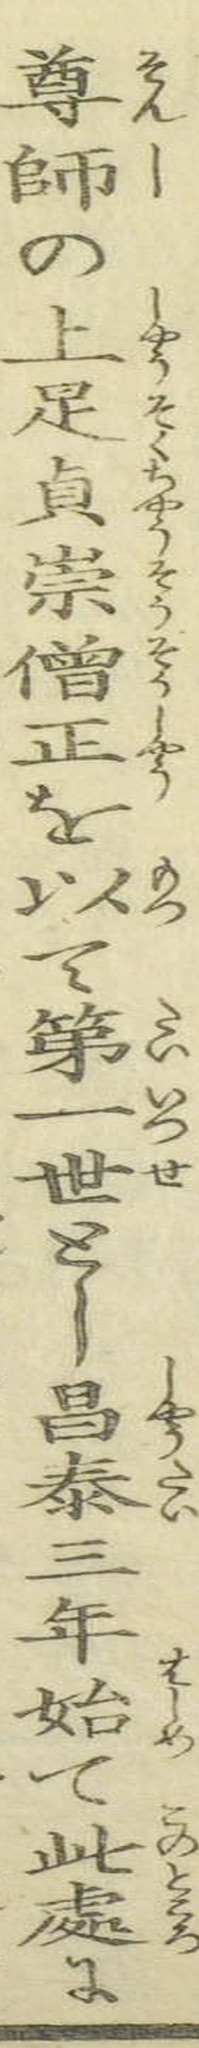尊師の上足貞崇僧正を以て第一世とし昌泰三年始て此處に
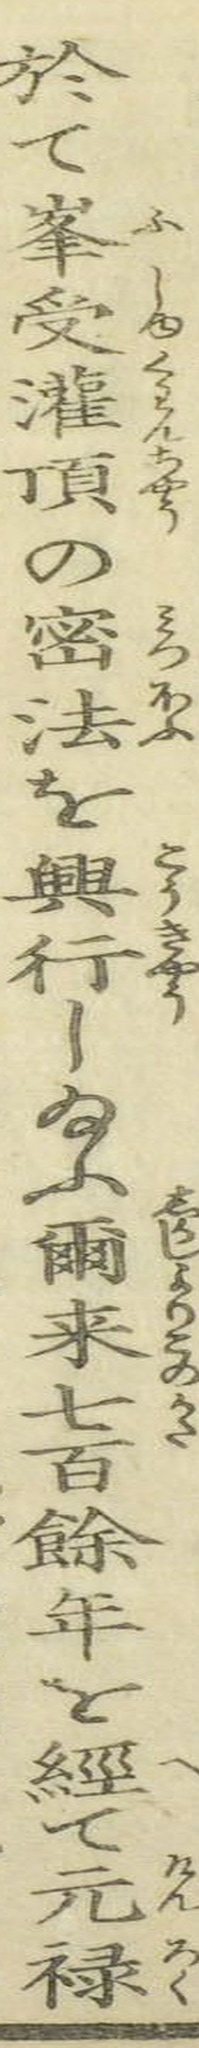於て峯受灌頂の密法を興行し給ふ爾来七百餘年を經て元禄
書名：江戸名所図会 20巻 巻之8
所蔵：東京学芸大学教育コンテンツアーカイブ
